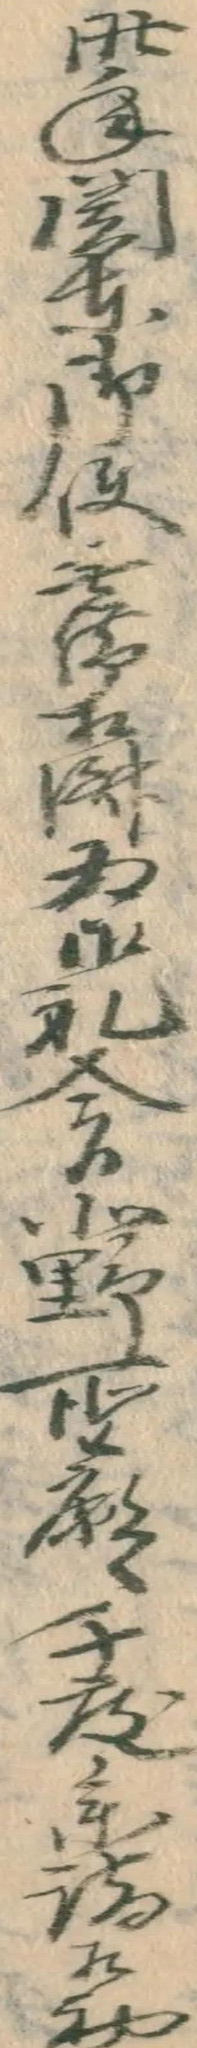昨年関東御使無滞相済為御礼入旨北野聖殿へ千度参詣相勤
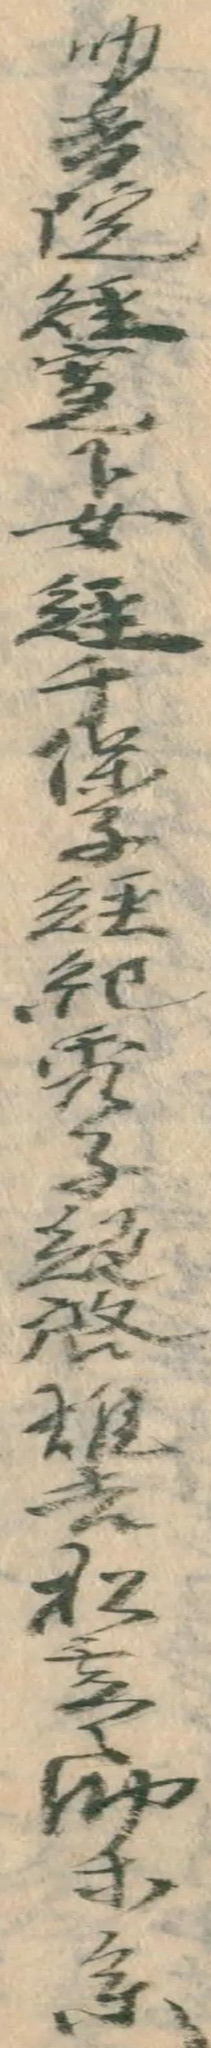明番院経寛下女経千保子経紀秀子経啓雄吉松亥之助等参
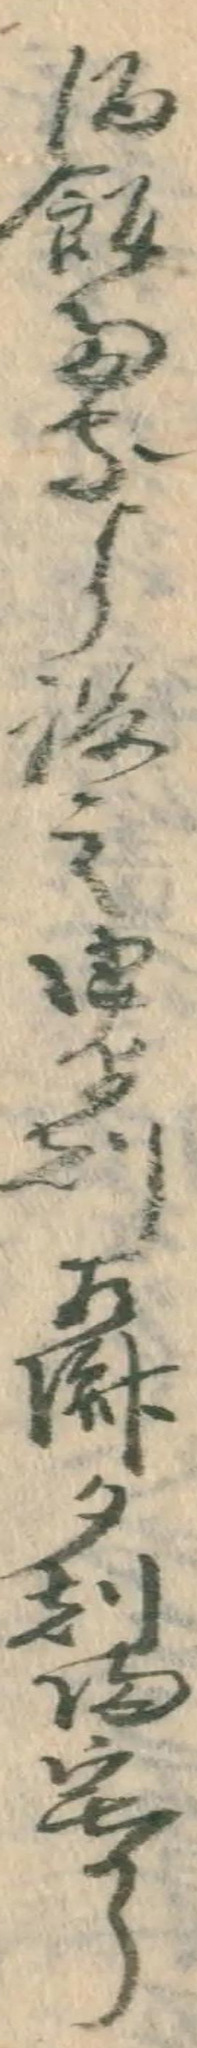酒飯両家より設之申半刻相済夕刻帰宅了
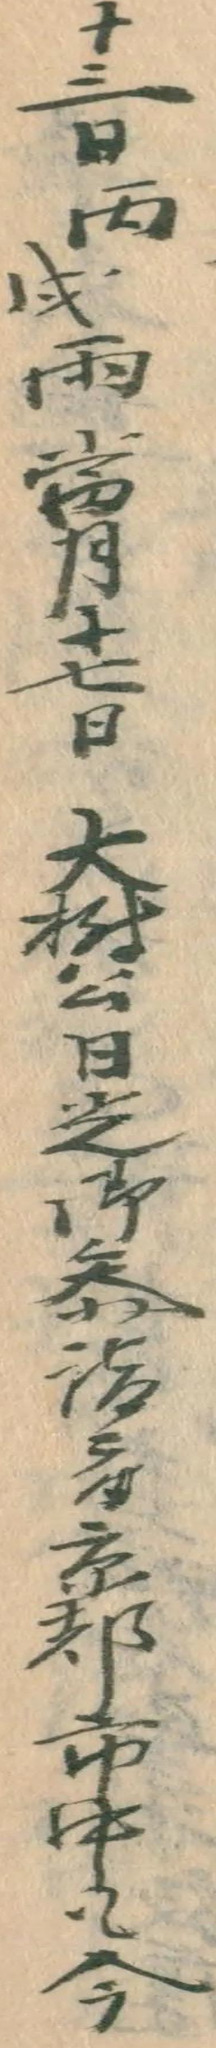十三日丙戌雨當月十七日大樹公日光御参詣ニ付京都市中も今

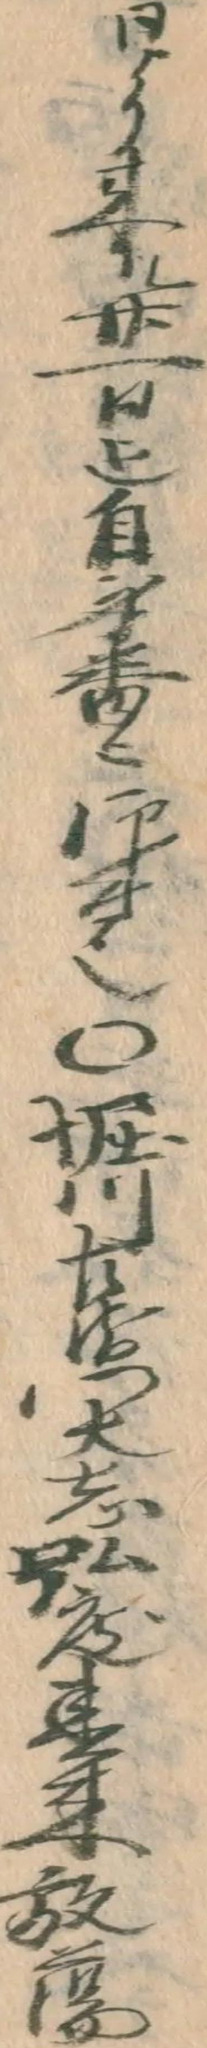日より来ル廿一日迄自身番被仰付也〇堀川左衛門大志弘度春来放蕩
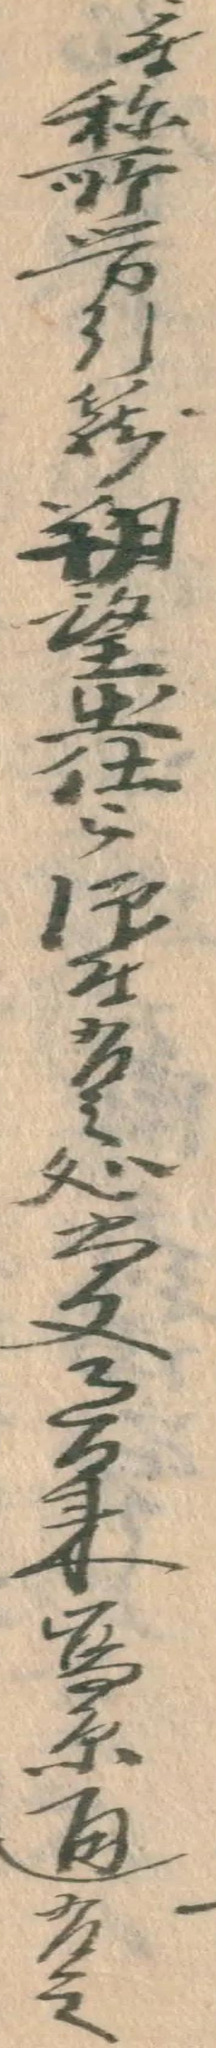ニ付称所労引籠朔望出仕被仰付有之処尚又過日寫原通有之
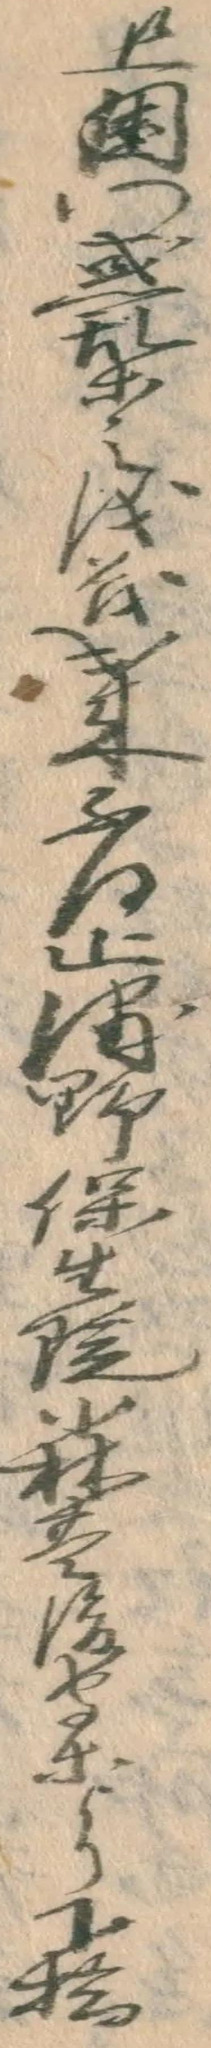上国門惑乱等之儀も出来不何止浦野保生院小林豊後守等より下橋
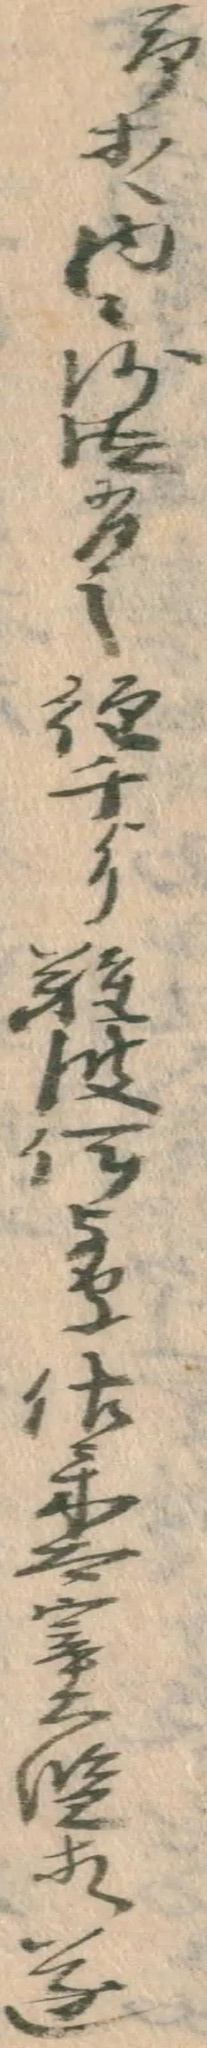予等へ内々沙汰有之経千より難波伊予守佐々木太宰大監等へ遂
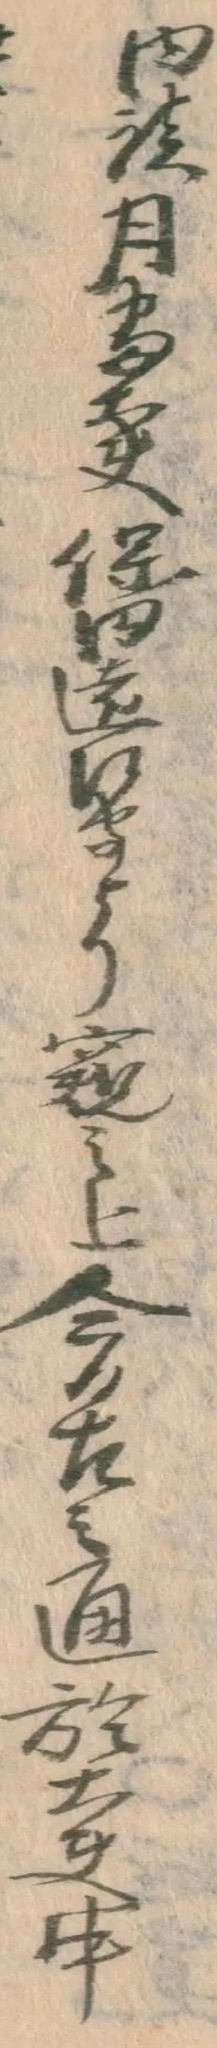内談月番大夫保田遠江守より窺之上今日左之通於大夫中
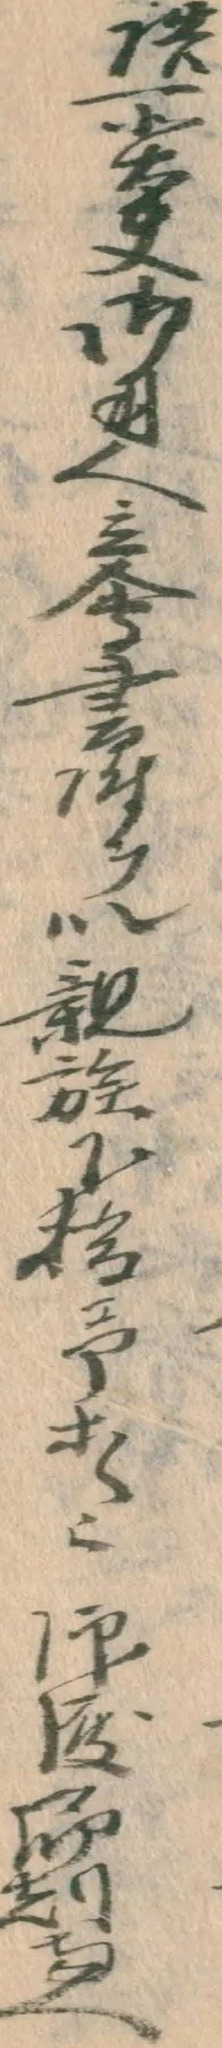詰所大夫御用人立會書附ヲ以親族下橋予等へ被仰渡即刻両人
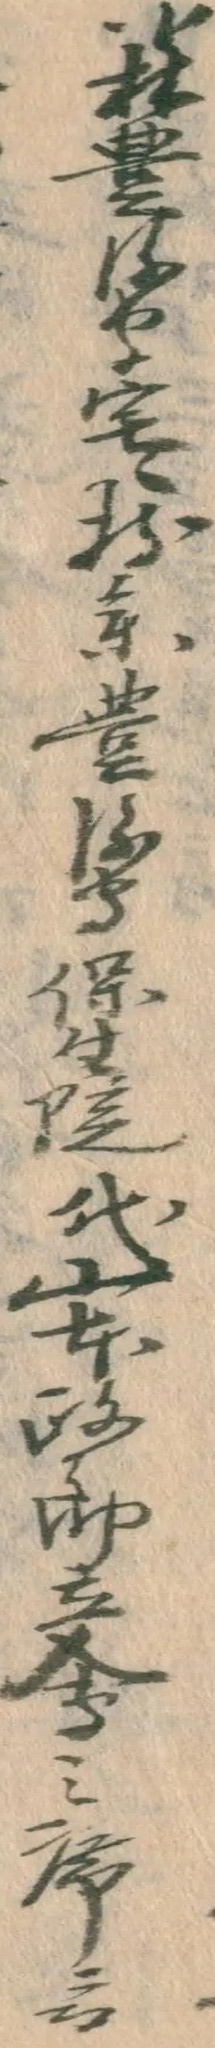小林豊後守宅へ持参豊後守保生院代山本政之助立會之席ニ而
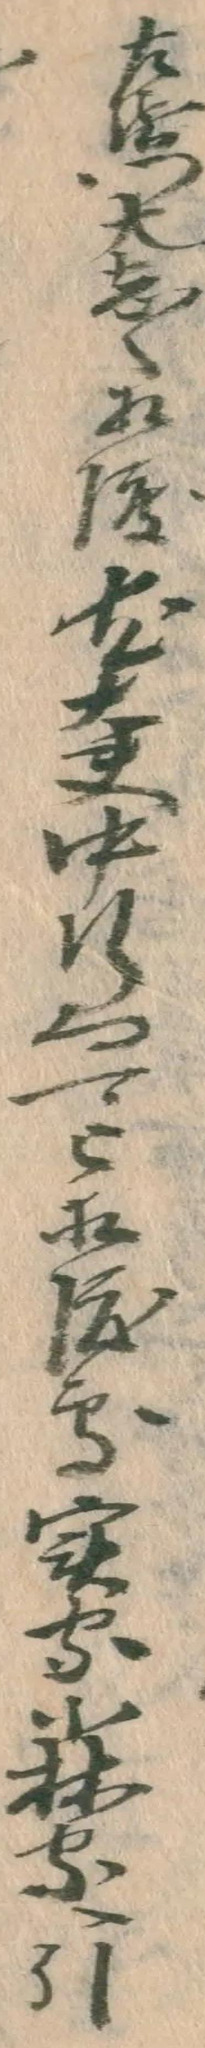左衛門大志へ相渡尤大夫中行向可被相渡處実家小林家へ引
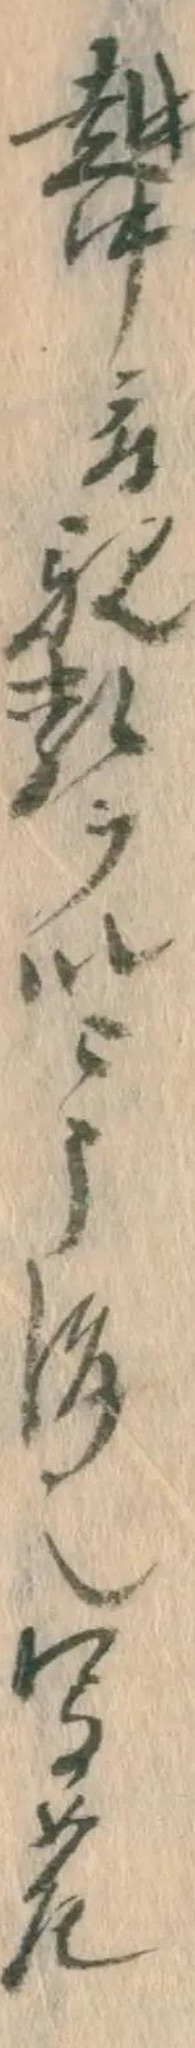越中ニ付親類ヲ以被申渡之写如左
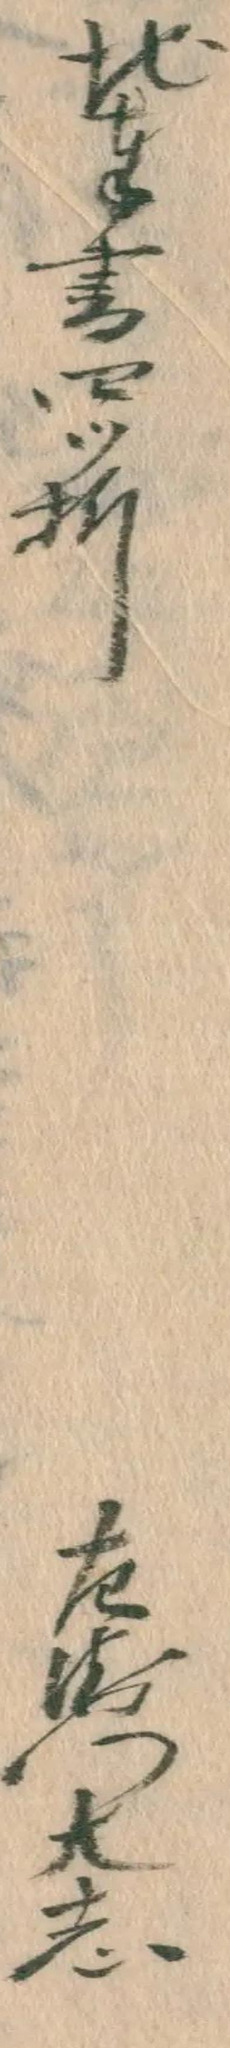地奉書四ツ折左衛門大志
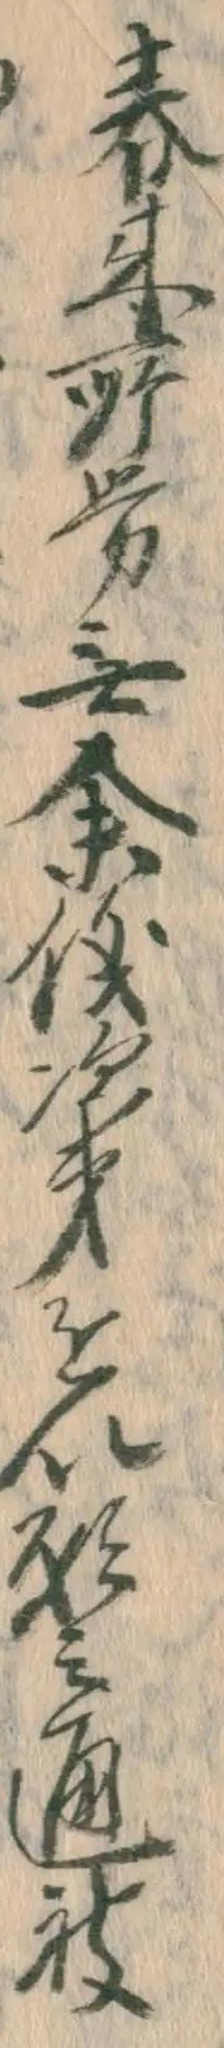春来所労無余儀次第を以願之通被
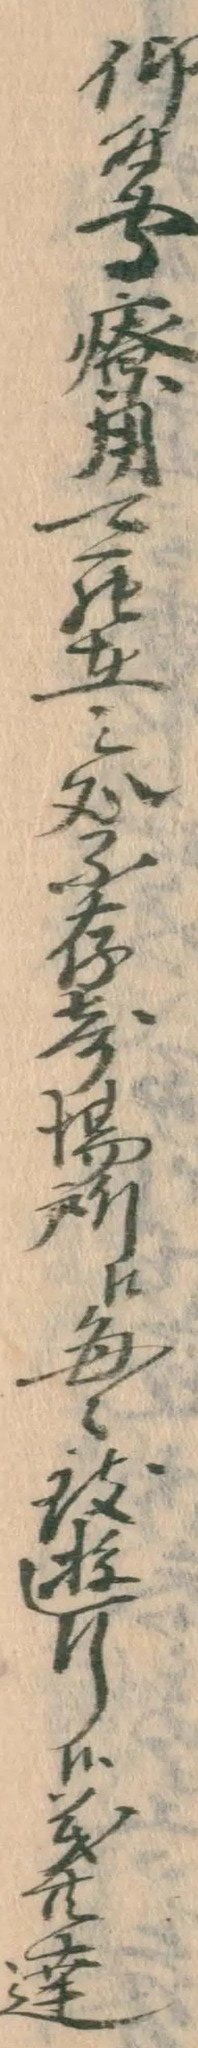仰付處療用可罷在之處不存寄場所江毎々致遊行候義共達
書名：賀茂社記録. 第69冊
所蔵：国立国会図書館 National Diet Library, JAPAN
